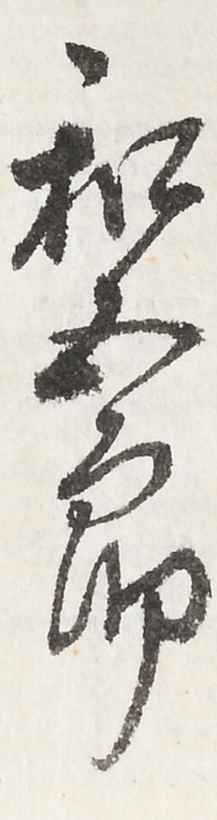和五郎
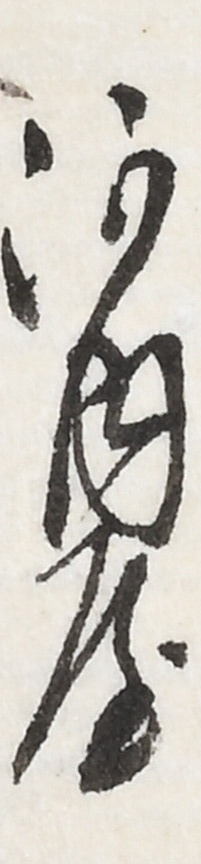河内屋
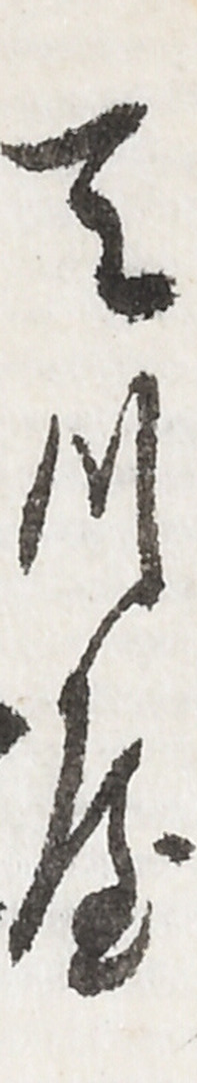天川屋
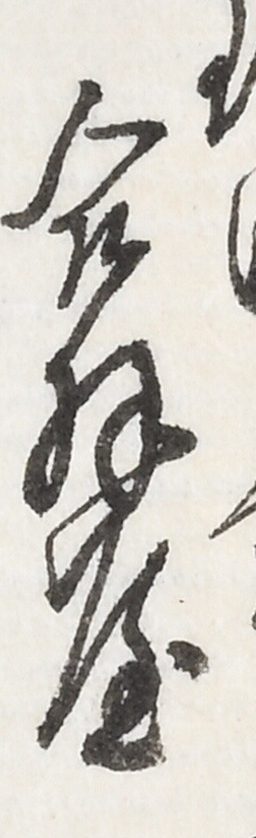合羽屋

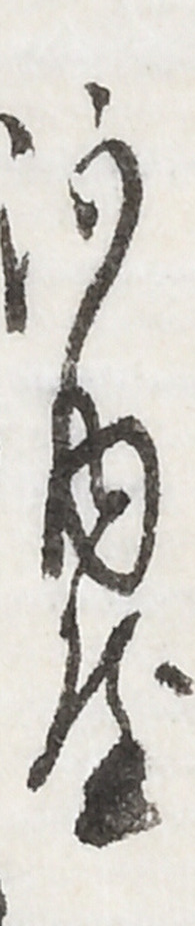河内屋
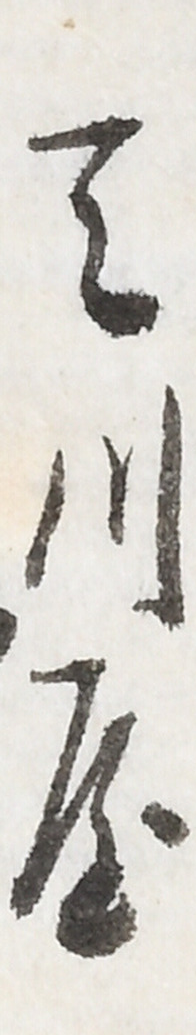天川屋
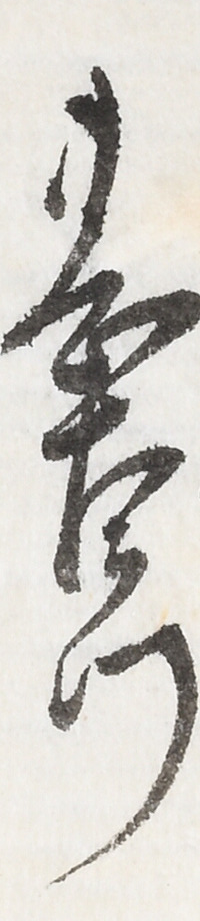甚右衛門
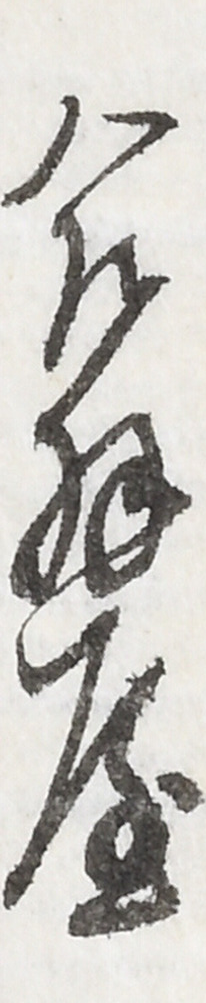合羽屋
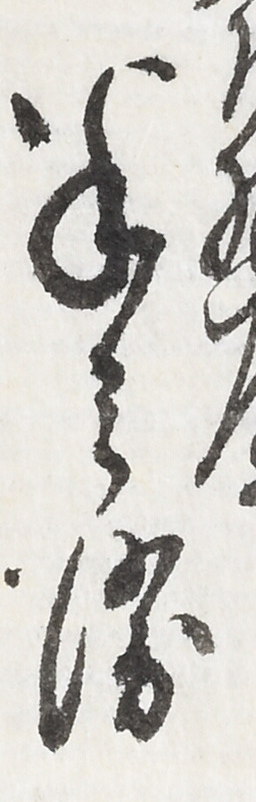半兵衛
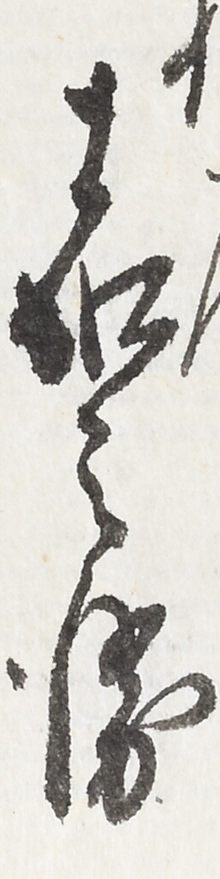嘉兵衛
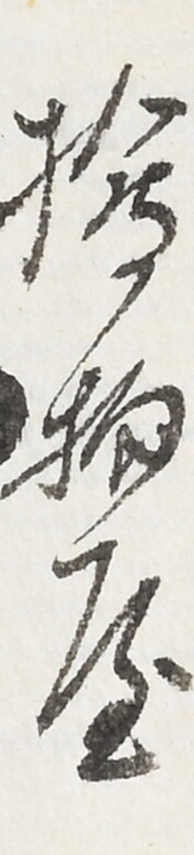檜物屋
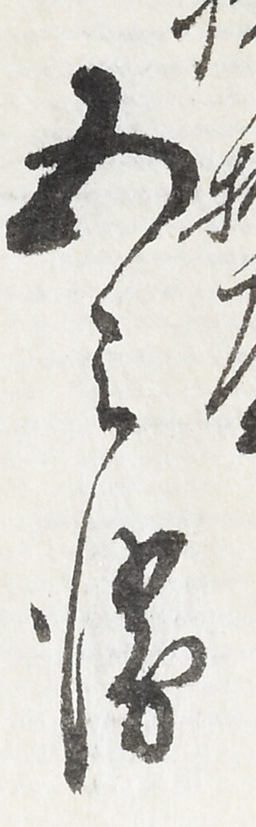五兵衛
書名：覚
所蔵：伊那市立高遠町図書館・合同会社AMANE
